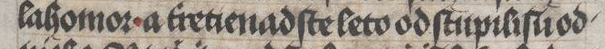lahomor.a tṙetienadſte leto odſtupiliſu od¬
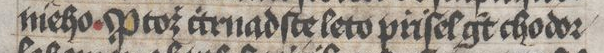meho.Ꝓtoż ċtrnadſte leto pṙiẛel ḡt chodor¬
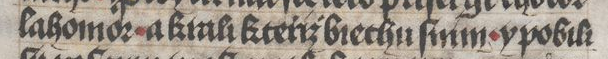lahomor.a krali kteříż biechu ſnim.y pobili
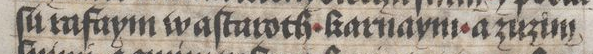ſu rafaym waſtaroth.karnaym.a zuzim
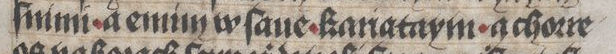ſnimi.a emim w ſane.kanataym.a chore¬
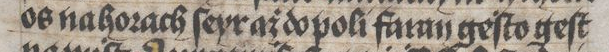os nahorach ſeyr aż do poli faran geẛto geſt
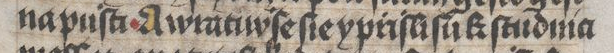na puẛti.A wratiwẛ̇e ſie y pṙiẛli ſu k ſtudnici
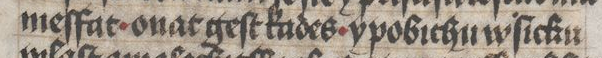meffat.onat geſt Rades.y pobichu wẛicku
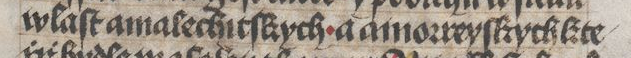wlaſt amalechitſkych.a amoreyſkych kte¬
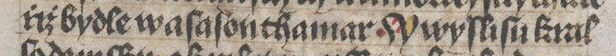ṙiż bydlé waſaſon thamar.Y wyẛli ſu kral
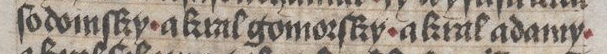ſodomſky.a kral gomorſky.a kral adamy.
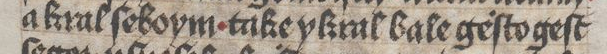a kral ſeboym.take y kral bale geẛto geſt
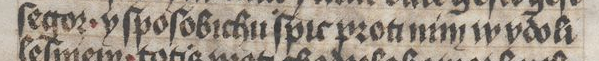ẛegoy.y ſpoſobichu ſpic proti nim n ydoli
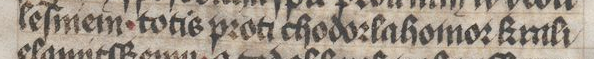leſniem.totiṡ proti chodorlahomor krali
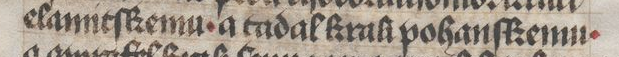elamitſkemu.a tadal krali pohanſkemu.
